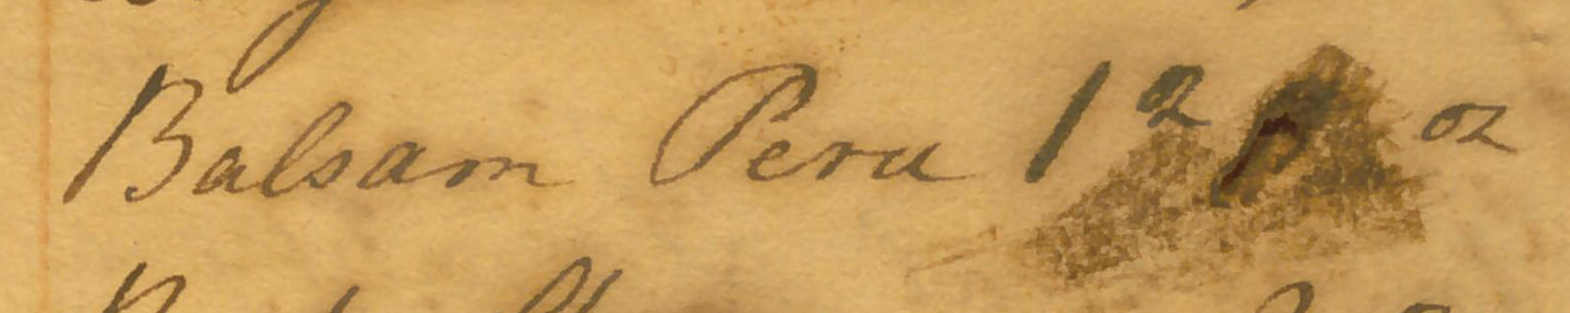Balsam Peru 1 ^oz [_] oz
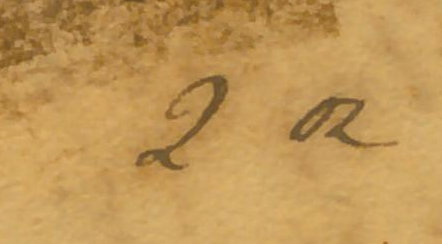2 oz
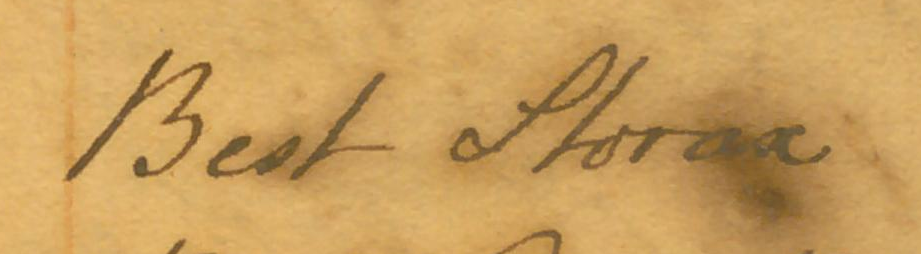Best storax
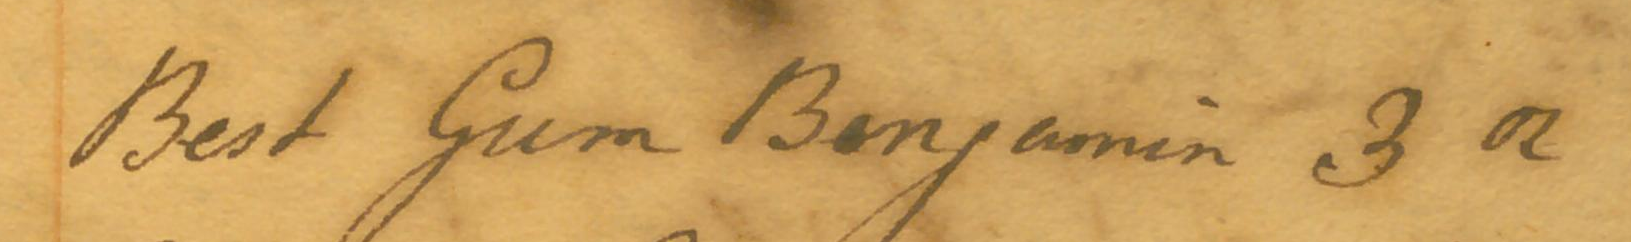Best Gum Benjamin 3 oz
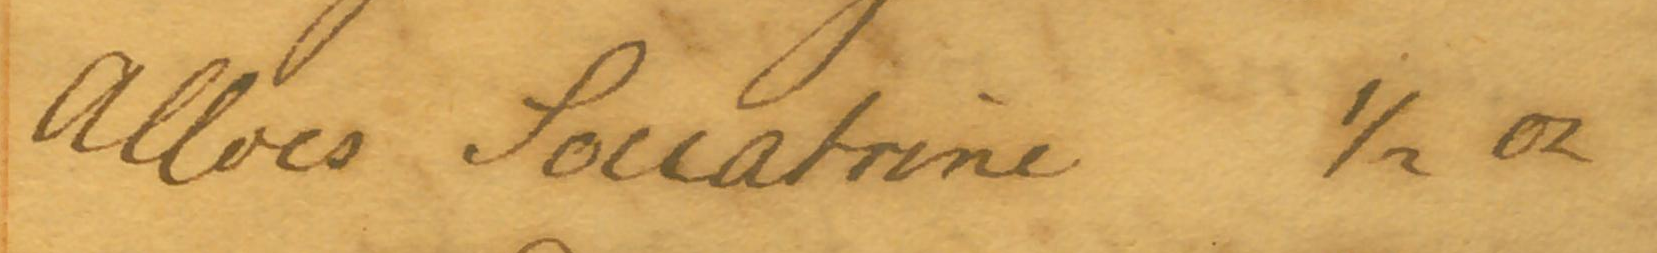Alloes Soccatrine 1/2 oz
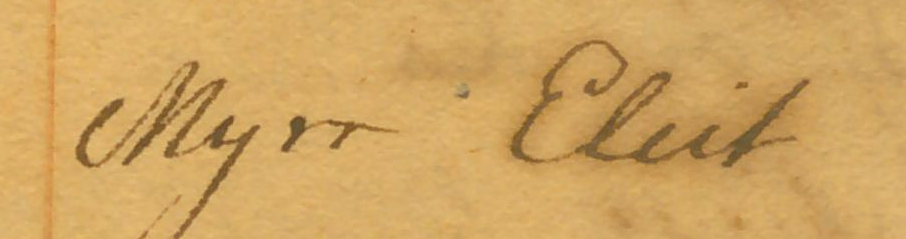Myrr Elcit
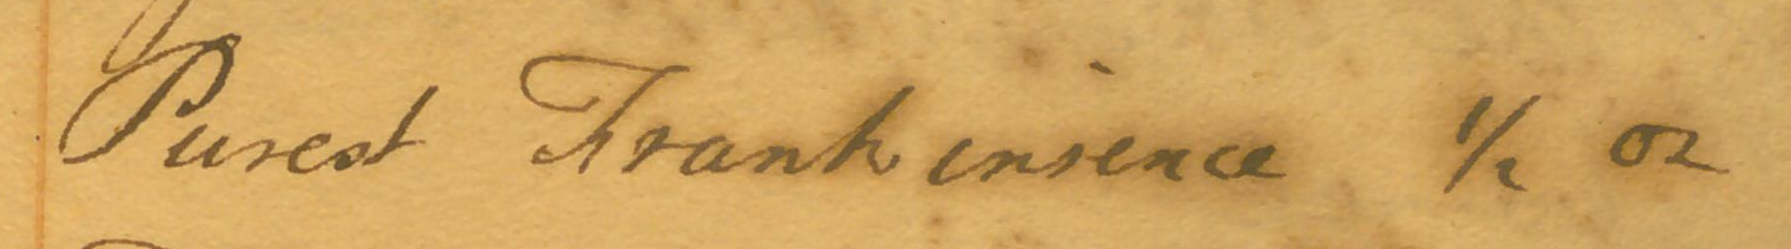Purest Frankinsence 1/2 oz
